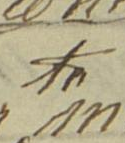to
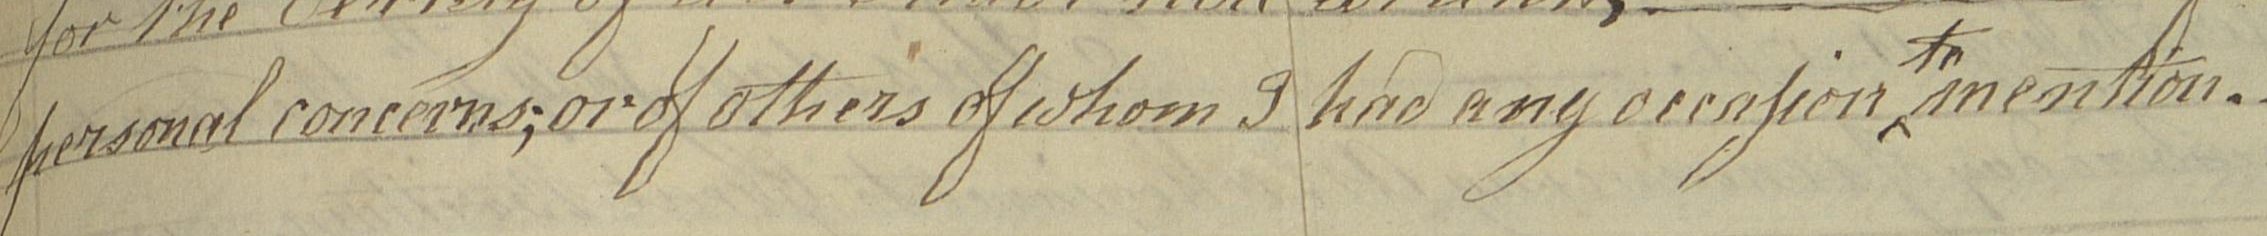personal conerns; or of others of whom I had any occasion ^ mention.
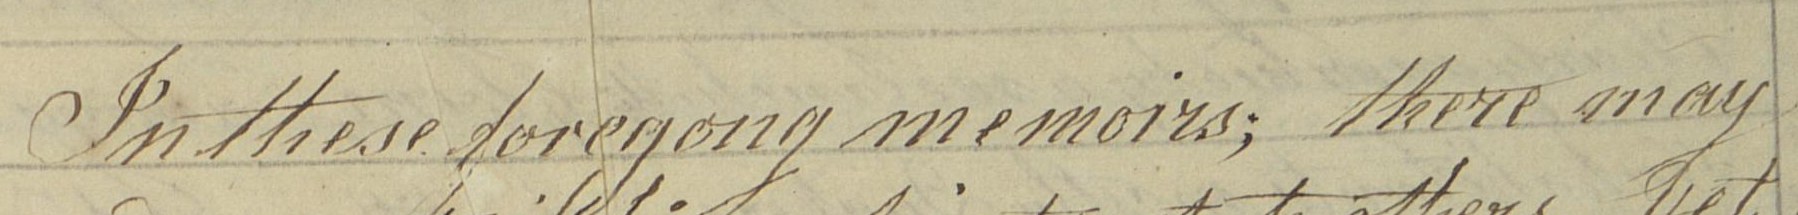In these foregong memoirs; there may
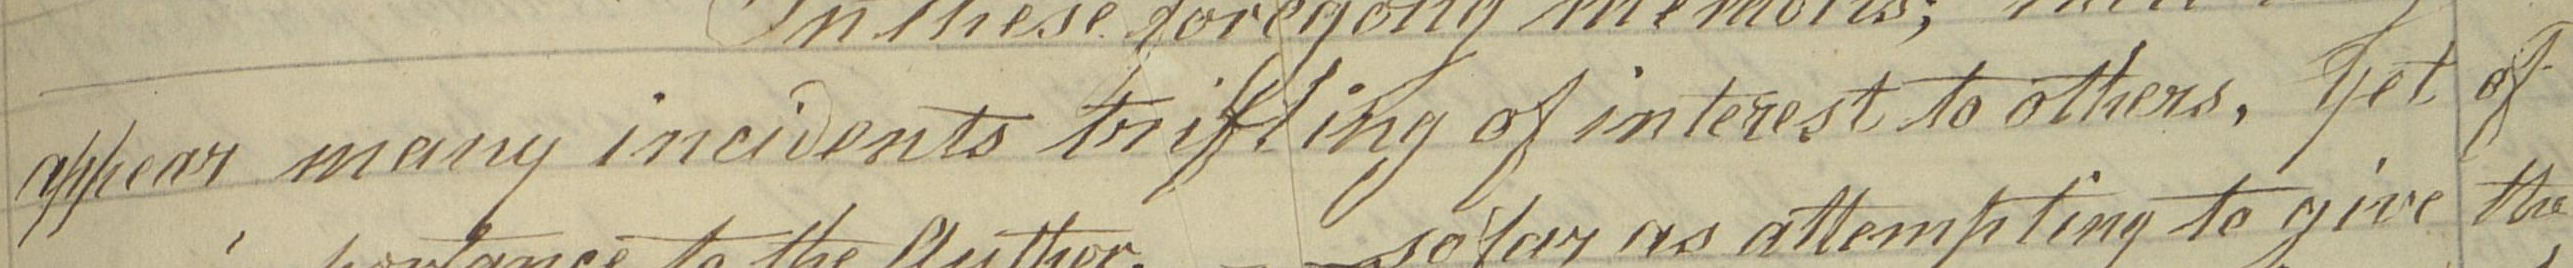appear many incidents trifling of interest to others, Yet of
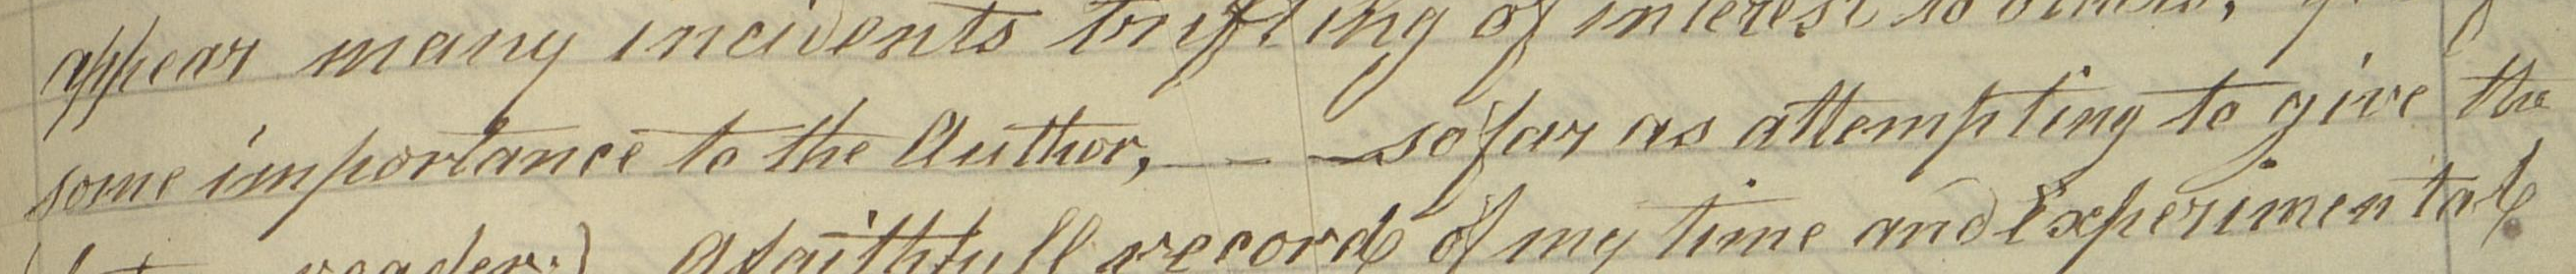some importance to the Author, so far as attempting to give the
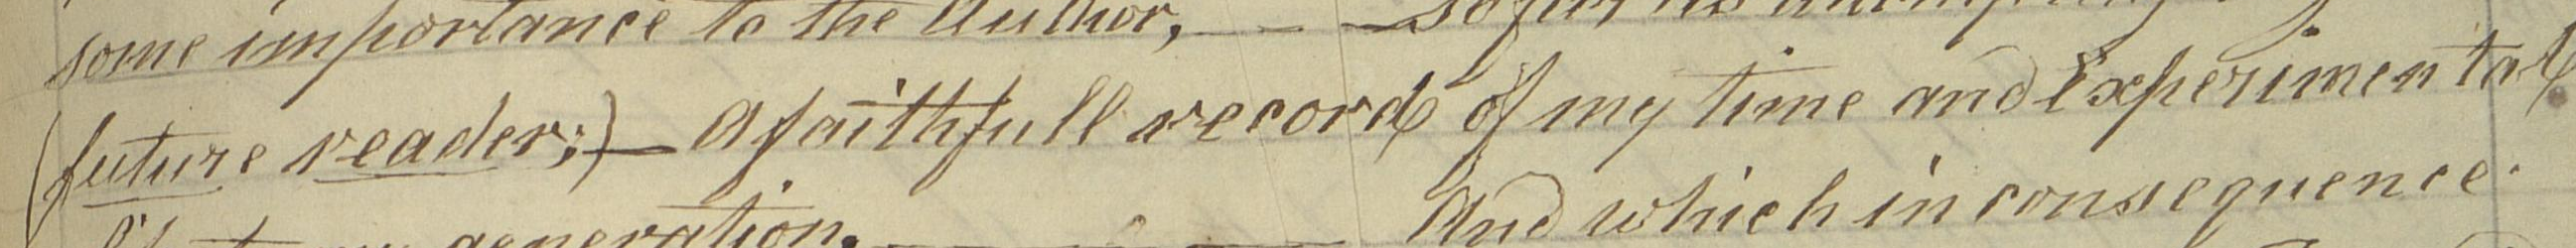future reader;) a faithfull record of my time and Experimental
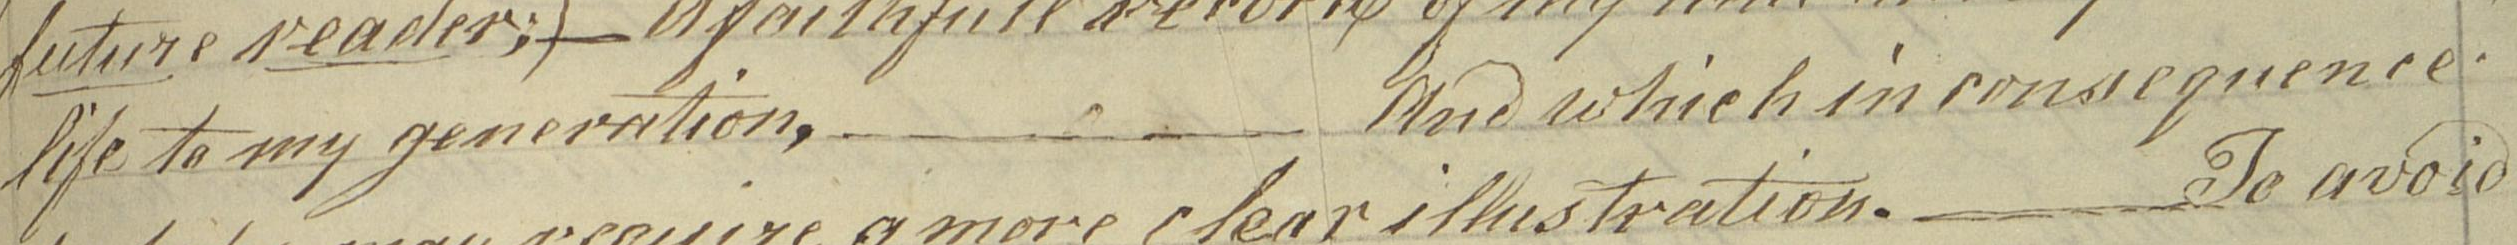life to my generation, And which in consequence
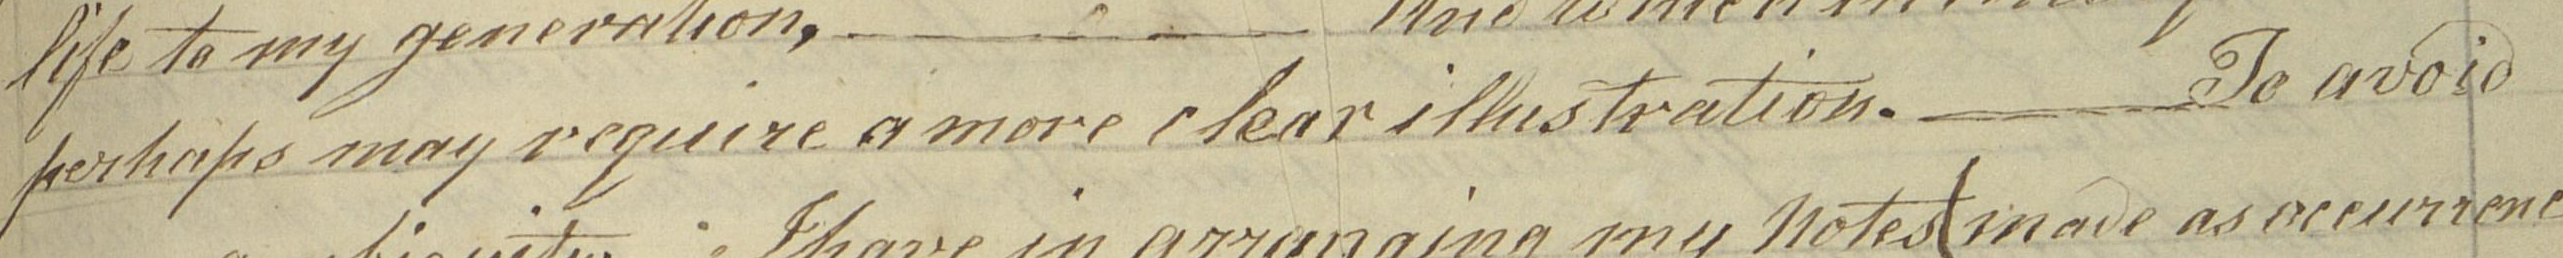perhaps may require a more clear illustration. To avoid
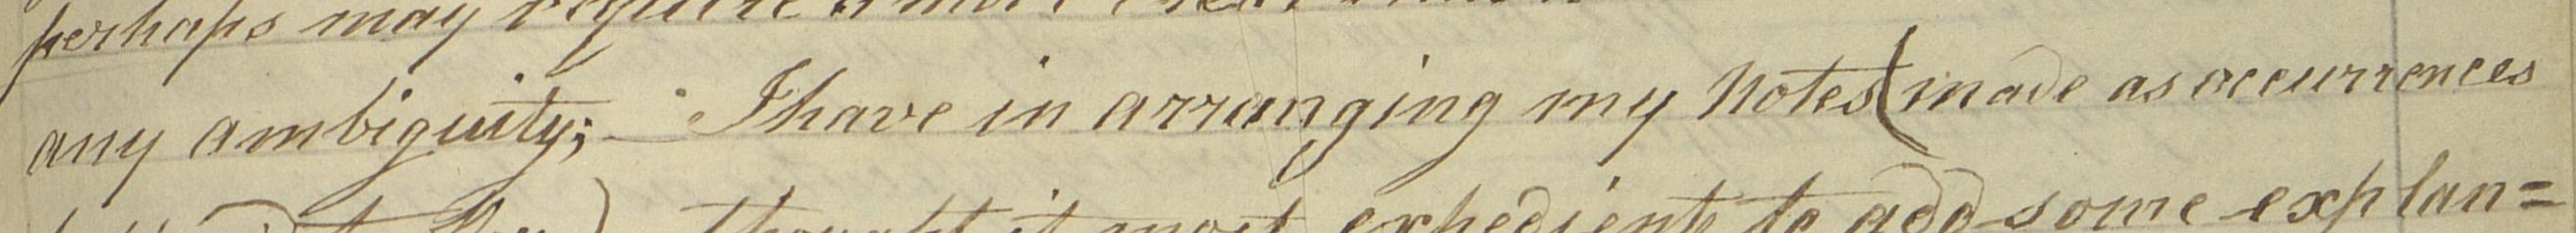any ambiguity; I have in arranging my Notes (made as occurences
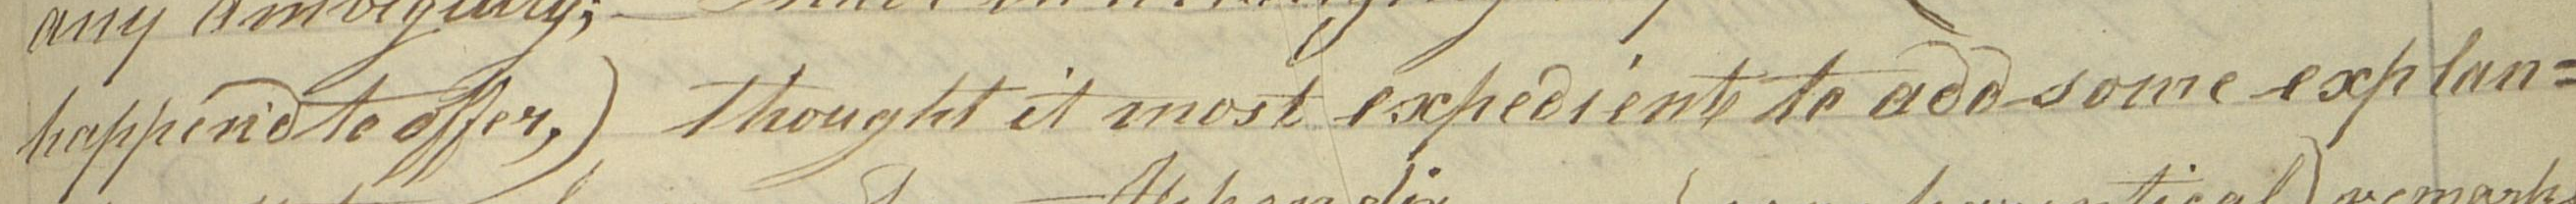happend to offer,) thought it most expedient to add some explan-
